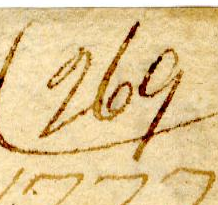269
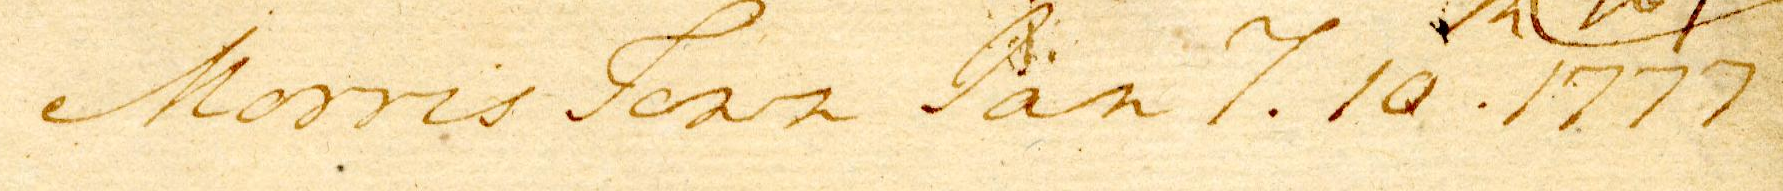Morris Town Jan^y. 10^th. 1777
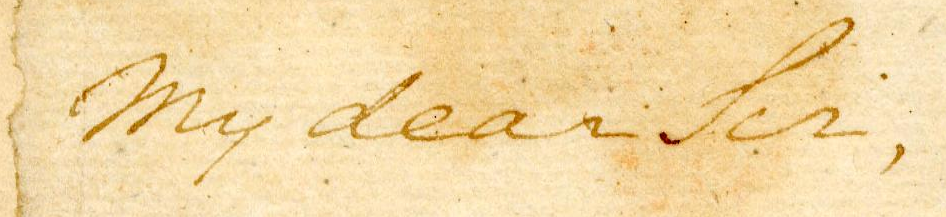My dear Sir,
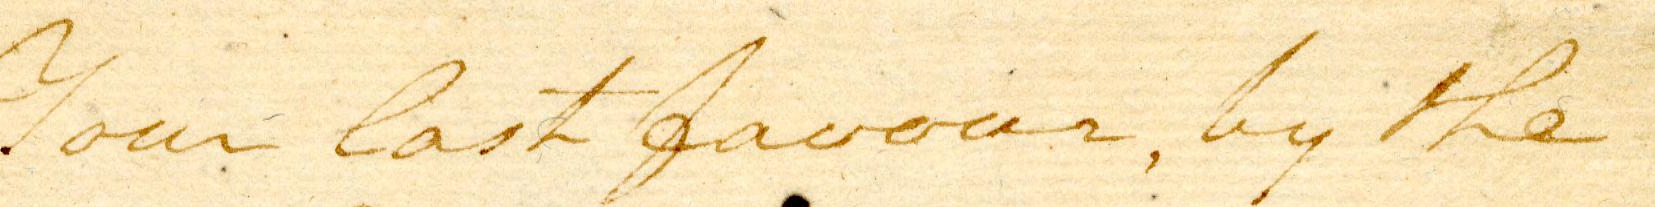Your last favour, by the
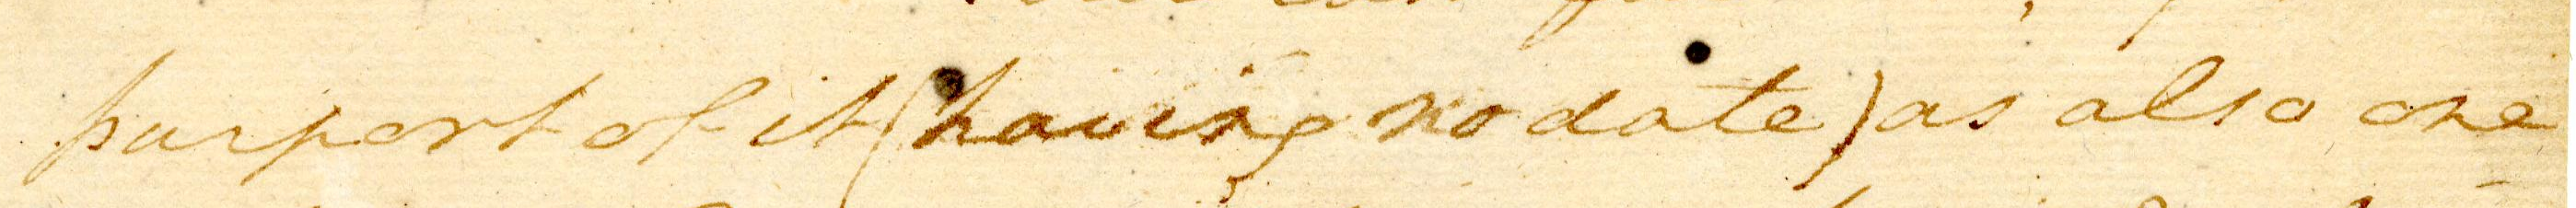purport of it (having no date) as also one
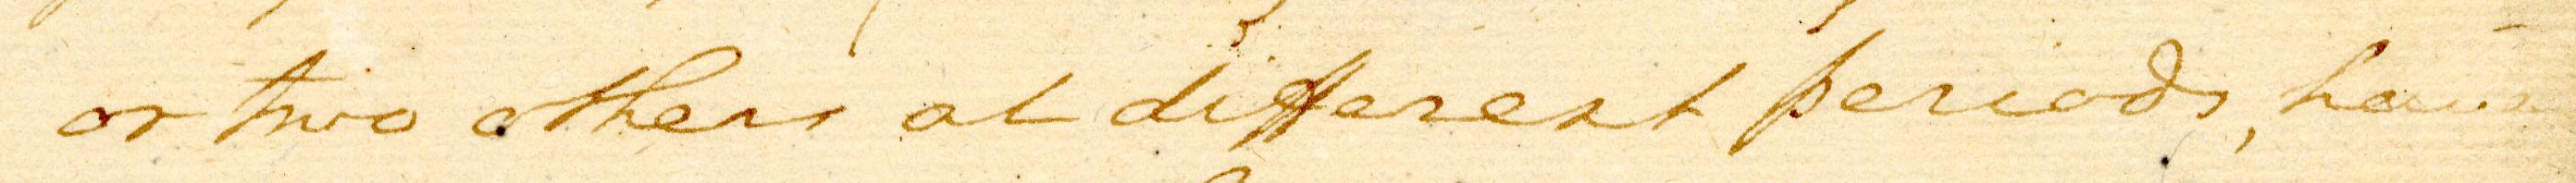or two others at different periods have
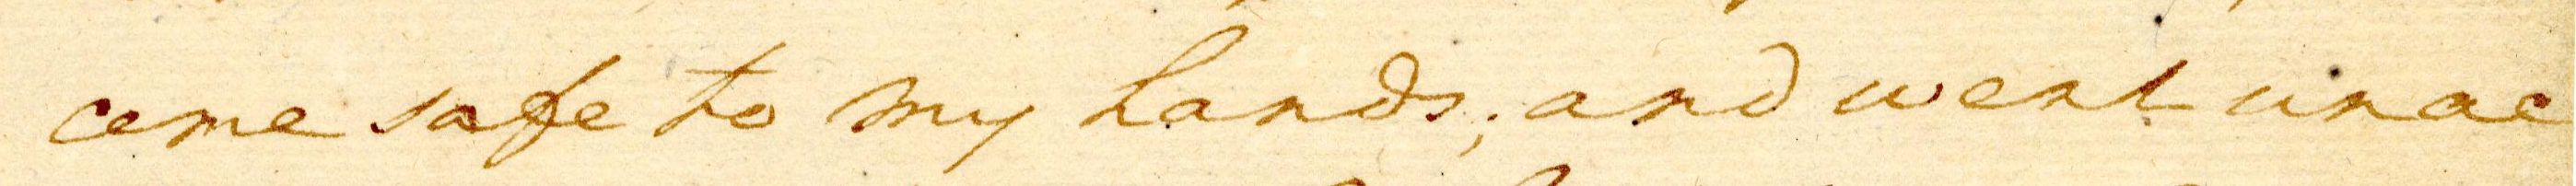come safe to my hands; and went unac-
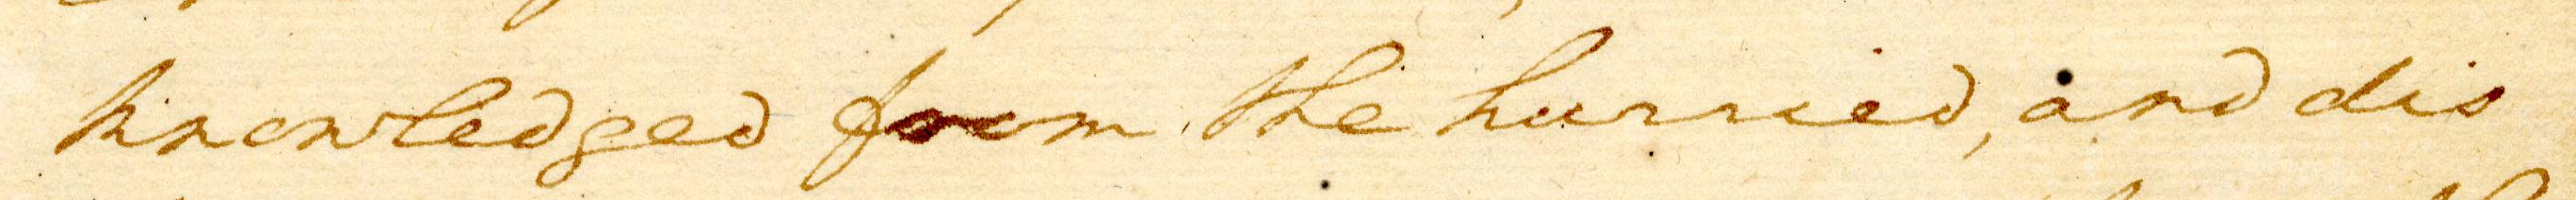knowledged from the hurried, and dis
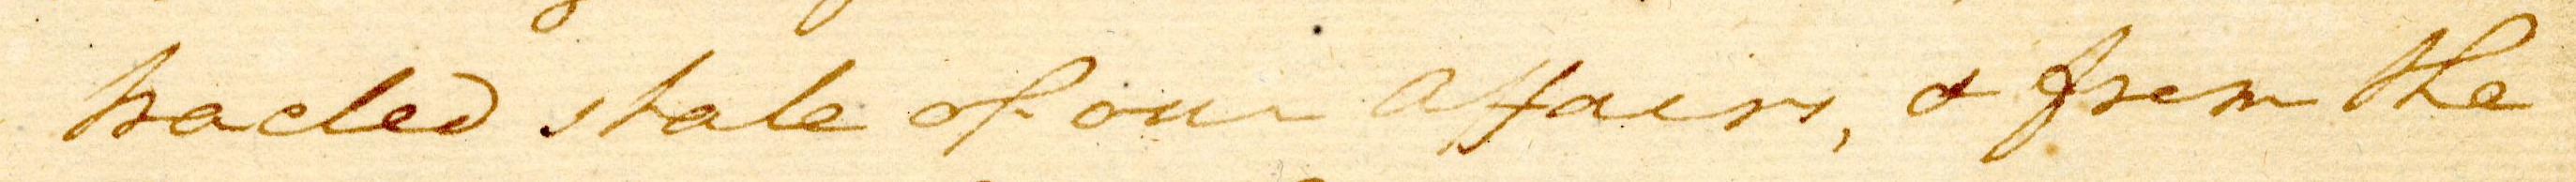tracted state of our Affairs, & from the
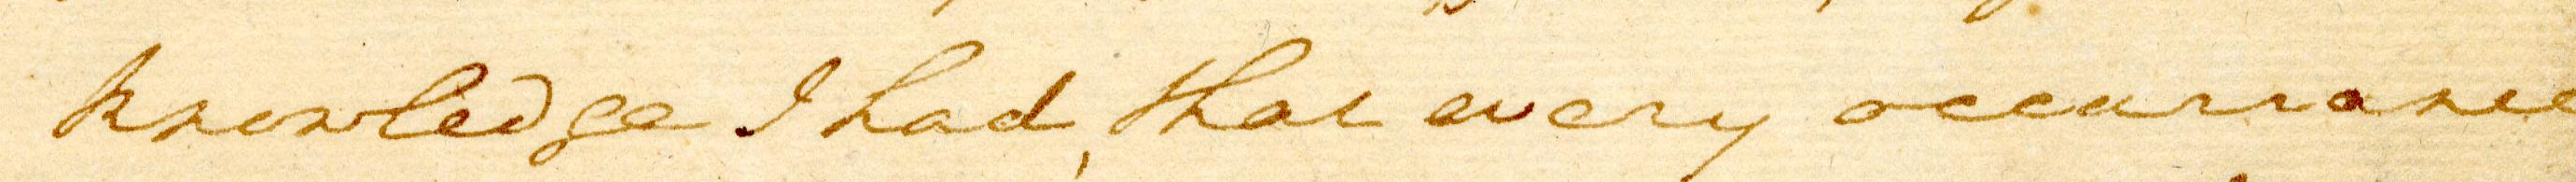knowledge I had that every occurrence
